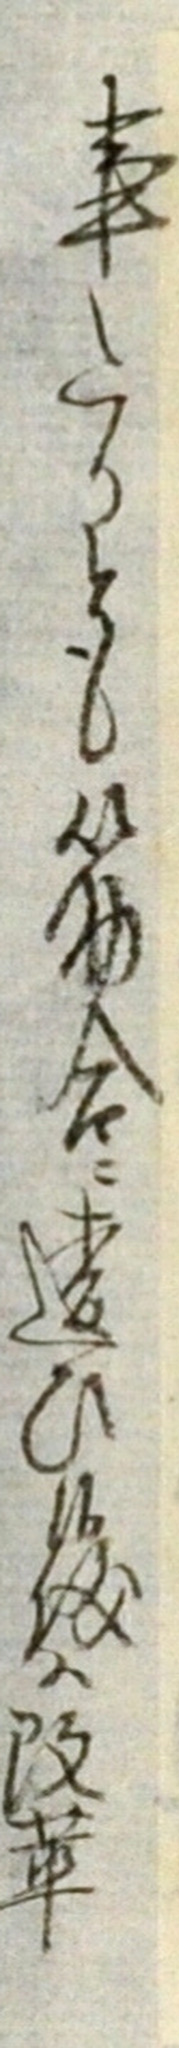事たりとも筋合違ひ候儀者改革
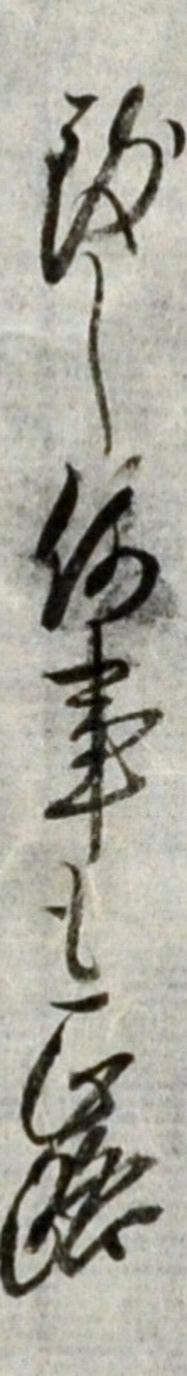致し何事も正路
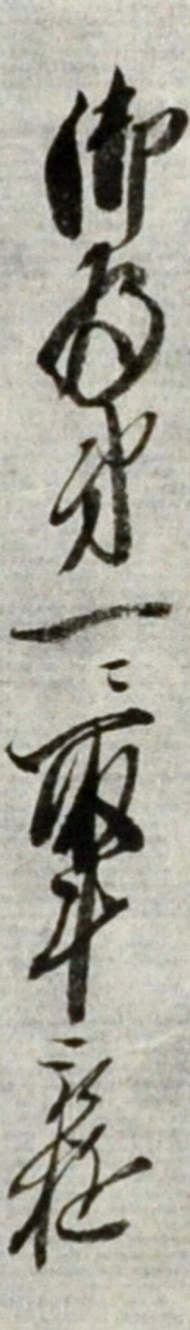御為第一取斗被遊
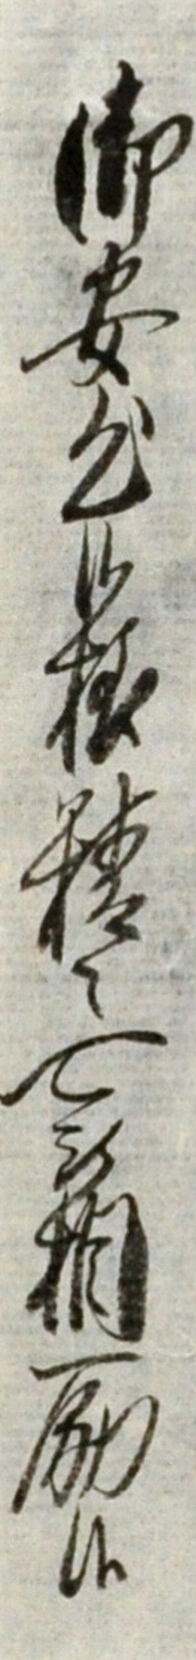御安心候様精々可被相励候
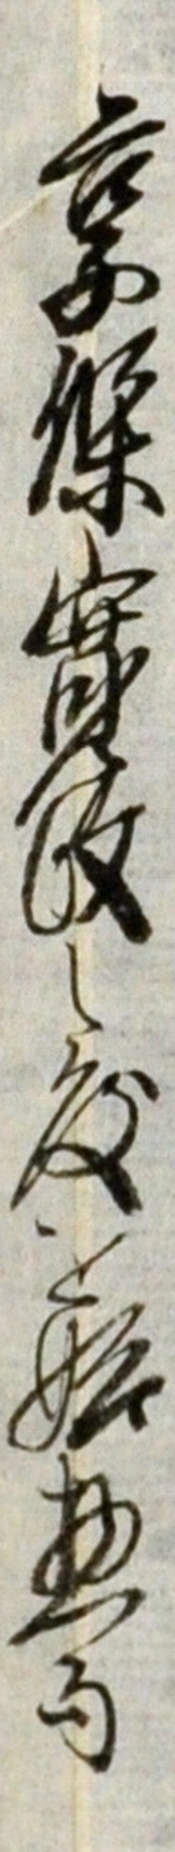享保寛政之度を始惣而
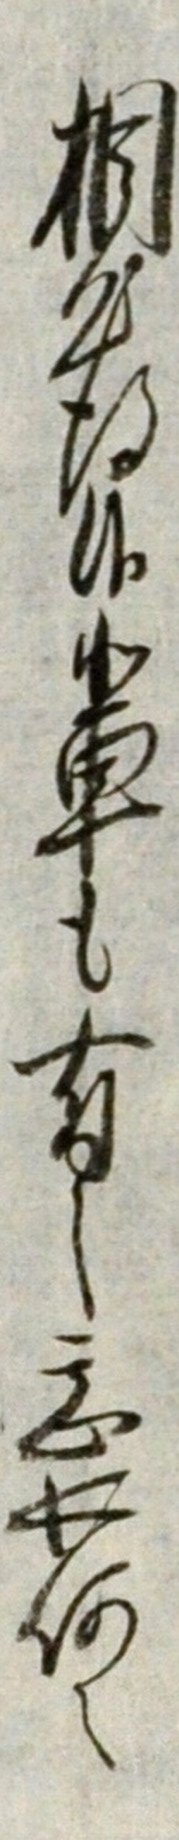相心得候輩も有之其長何之
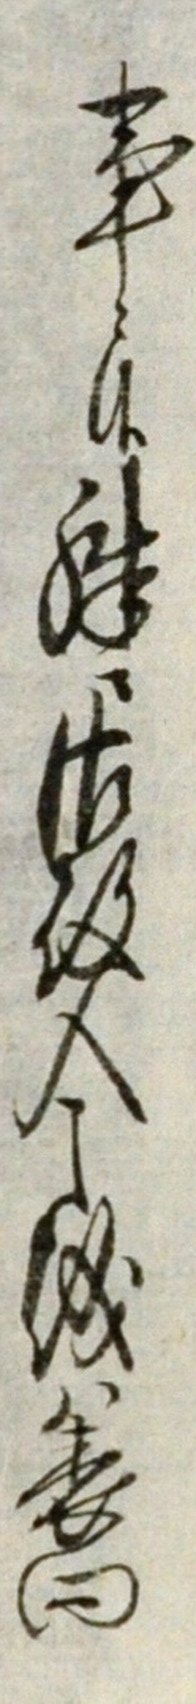事ニ候殊御役入之儀ハ表向
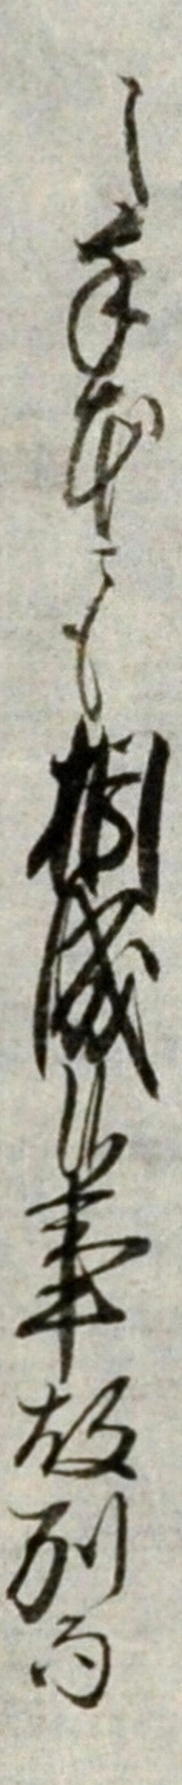之手本にも相成候殊故列而
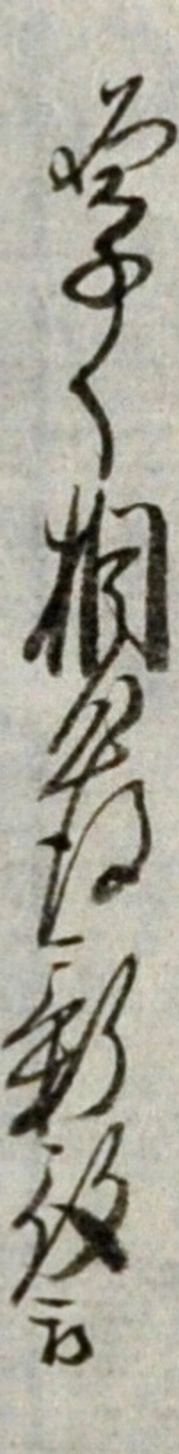厚く相心得新役被
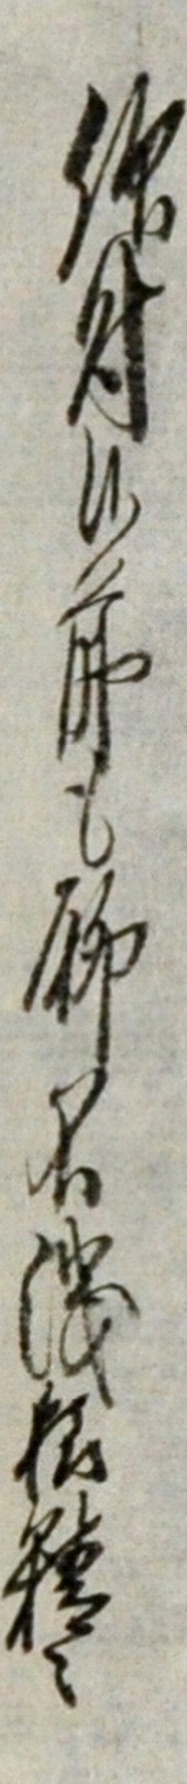仰付候節も聊不浅様精々

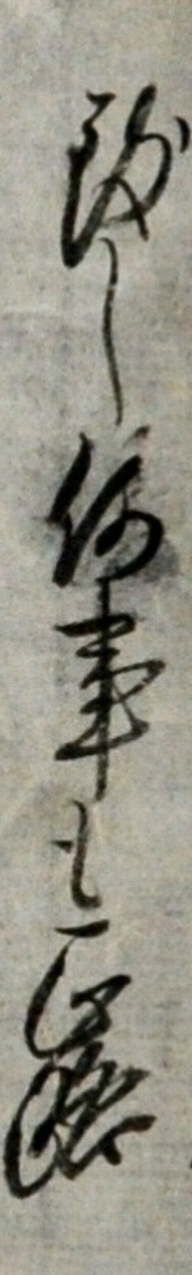致し何事も正路
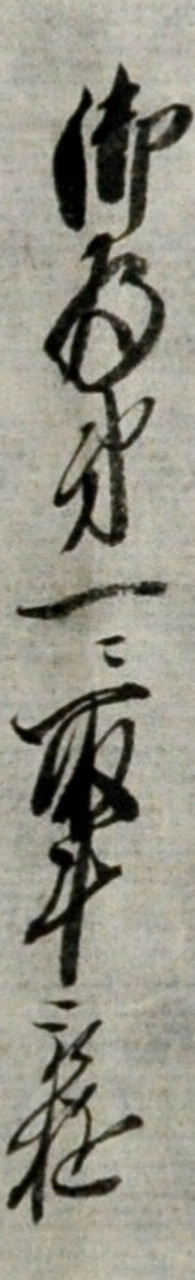御為第一取斗被遊
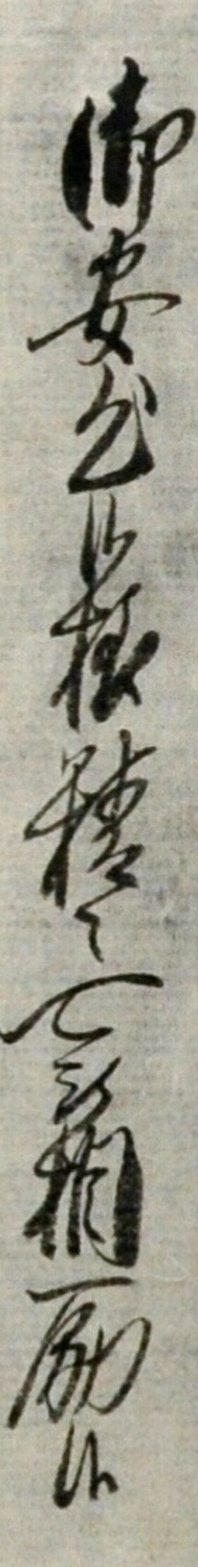御安心候様精々可被相励候
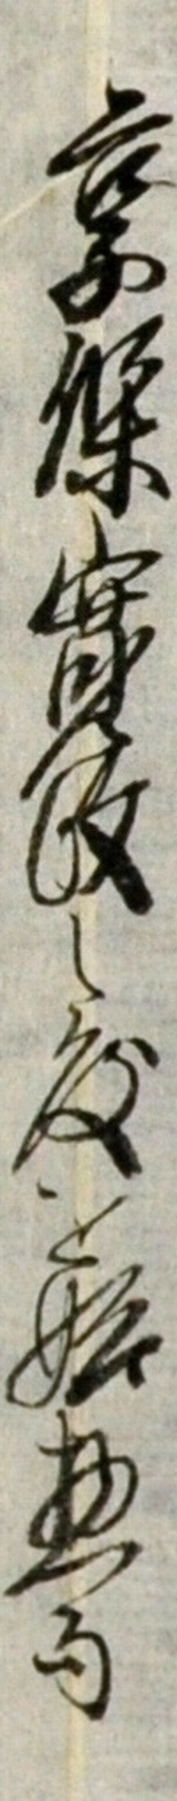享保寛政之度を始惣而
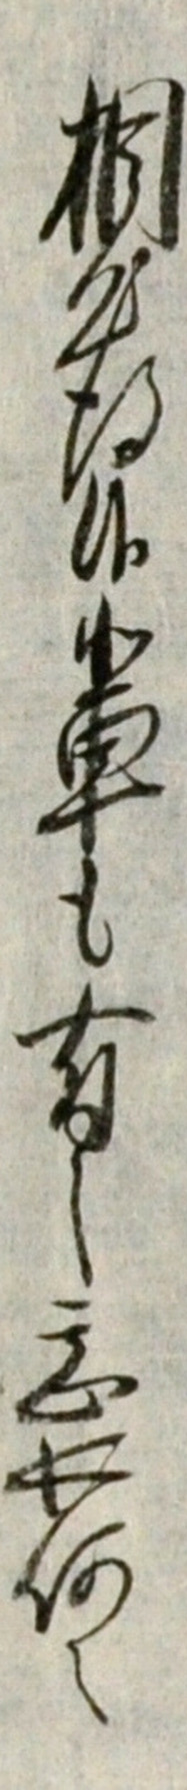相心得候輩も有之其長何之
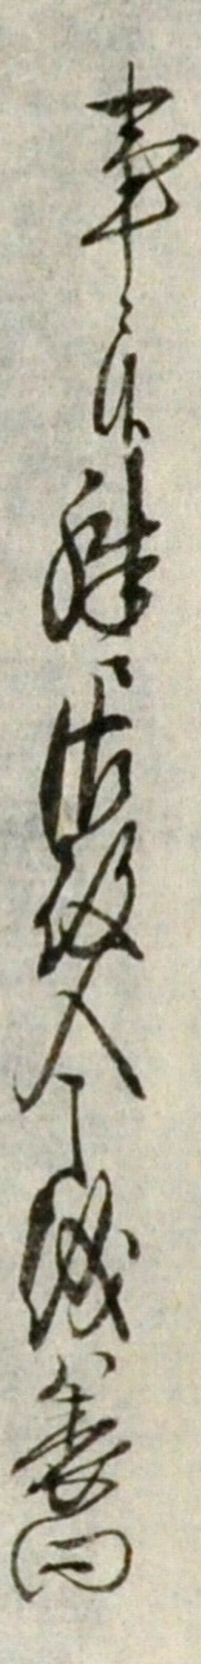事ニ候殊御役入之儀ハ表向
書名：若年寄御役中御調書付
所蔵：伊那市立高遠町図書館・合同会社AMANE
